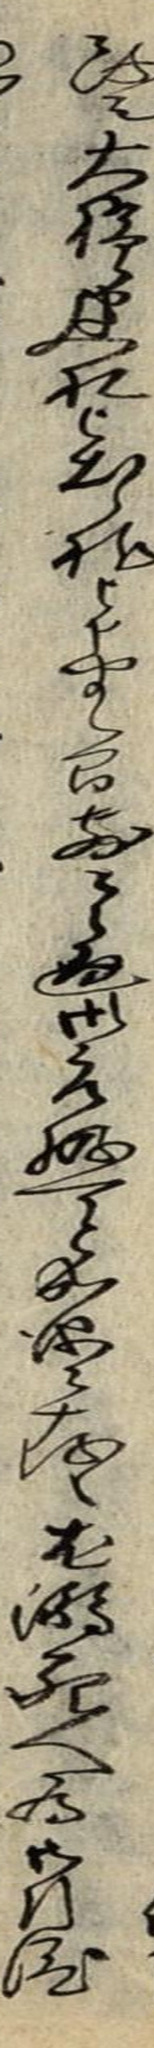致シ大橋へ建札被出候様被申聞候間前々之通御取扱可被成儀と存候尤溺死人為御引渡
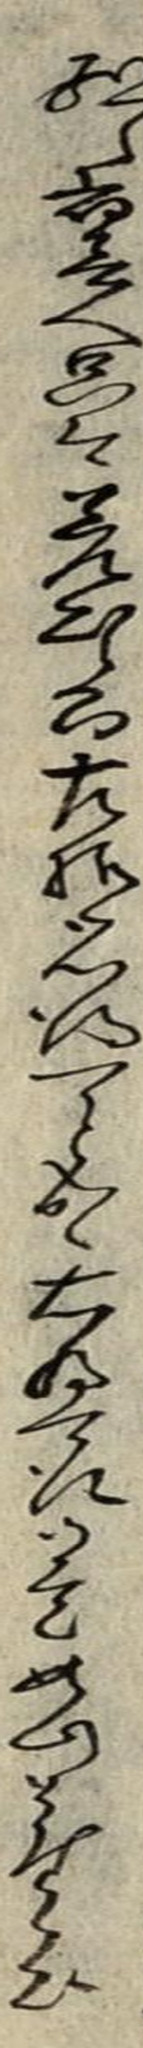組之者壱人只今差出候間左様御心得可被成候右為可得御意如此御座候以上
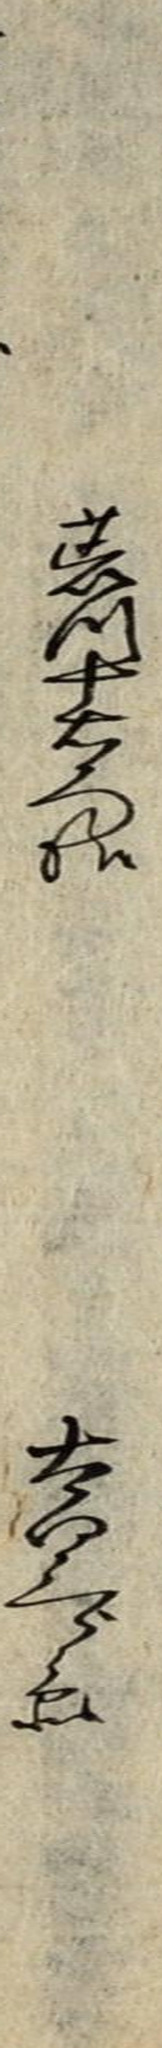荒川十右衛門様太田三郎兵衛
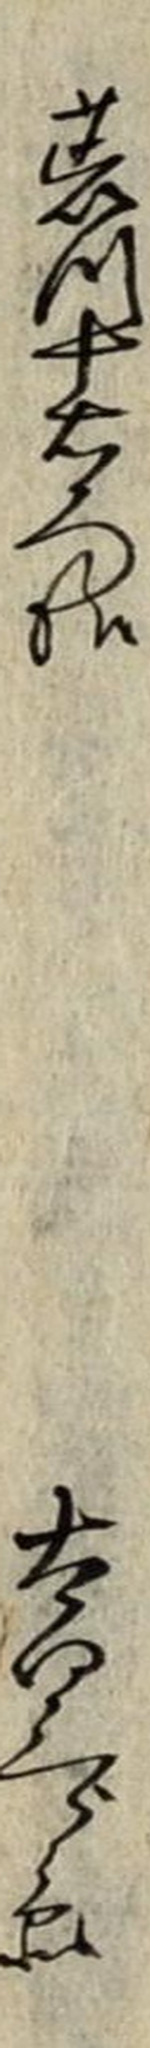荒川十右衛門様太田三郎兵衛
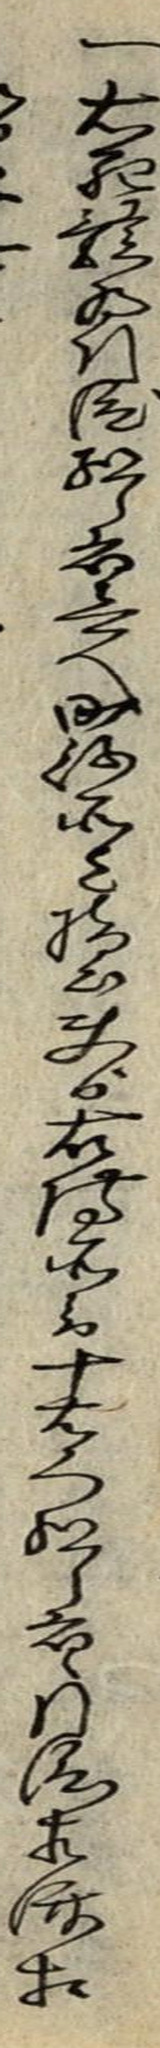一右死骸為引渡組之者壱人町役所迄指出夫ゟ右場所にて十右衛門組之者へ引渡相済相
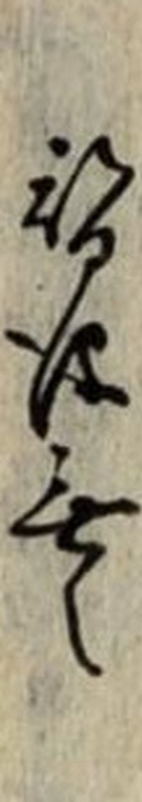替儀無之
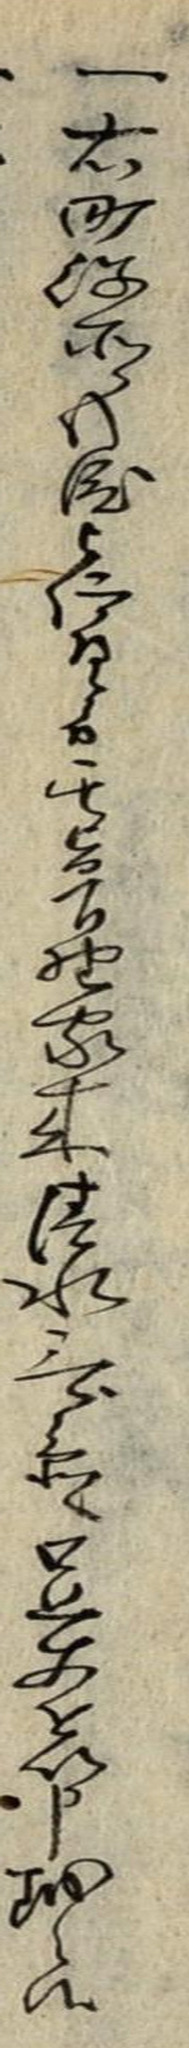一右町役所へ引渡被仰付候に付其旨下野家来清水三郎兵衛へ口上使を以申越し候
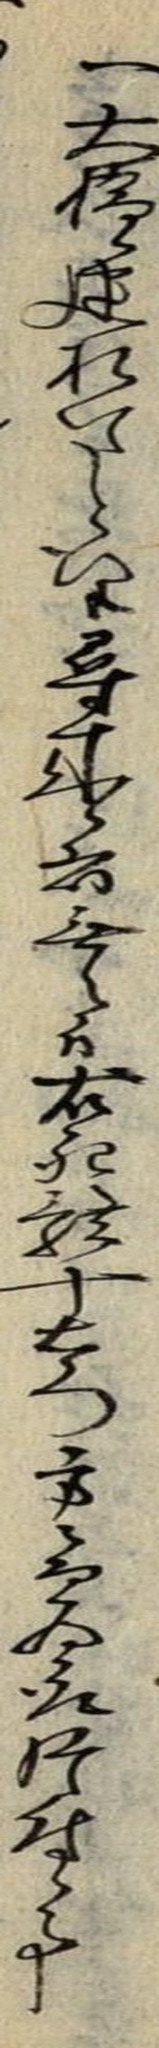一大橋へ建札いたし候得共尋来候者無之に付右死骸十右衛門方にて為取片付候事
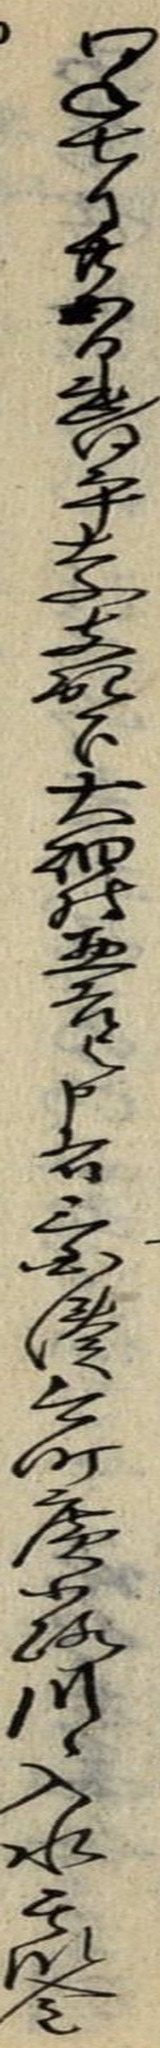一同年七月廿五日武田平大夫支配下大畑村惣吉と申者三国湊今町広小路川へ入水其段金
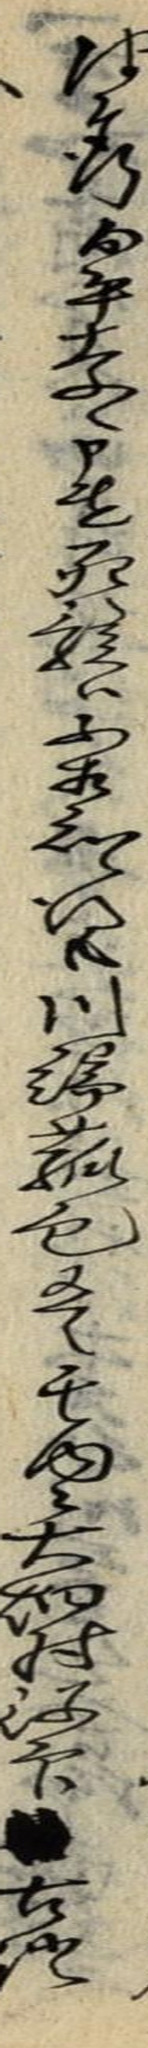津奉行ゟ平大夫へ申遣死骸は不相知候得共川端菰包有之其内に大畑村役印古証
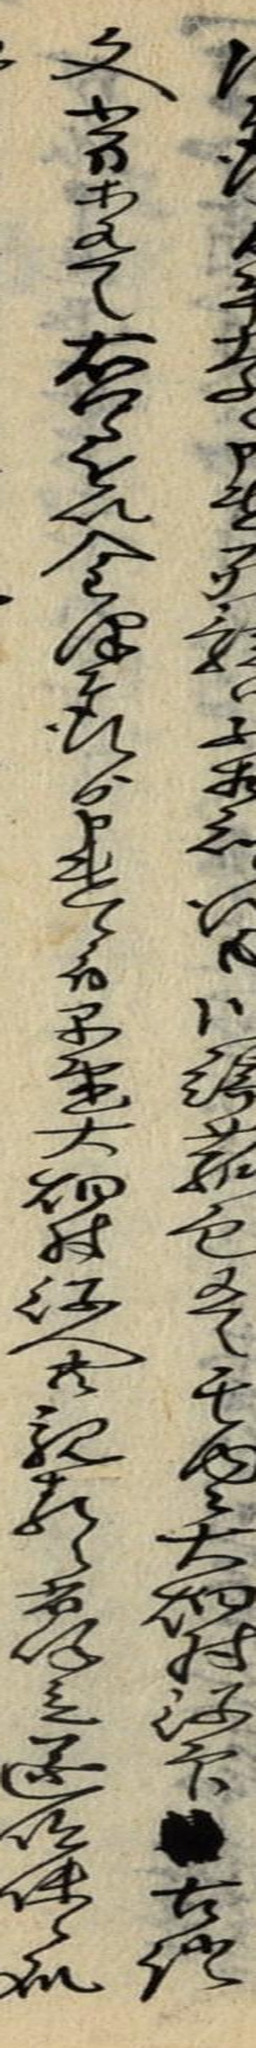文書付等有之右写を以金津奉行ゟ申遣候に付早速大畑村役人共親類之者呼立遂吟味候処
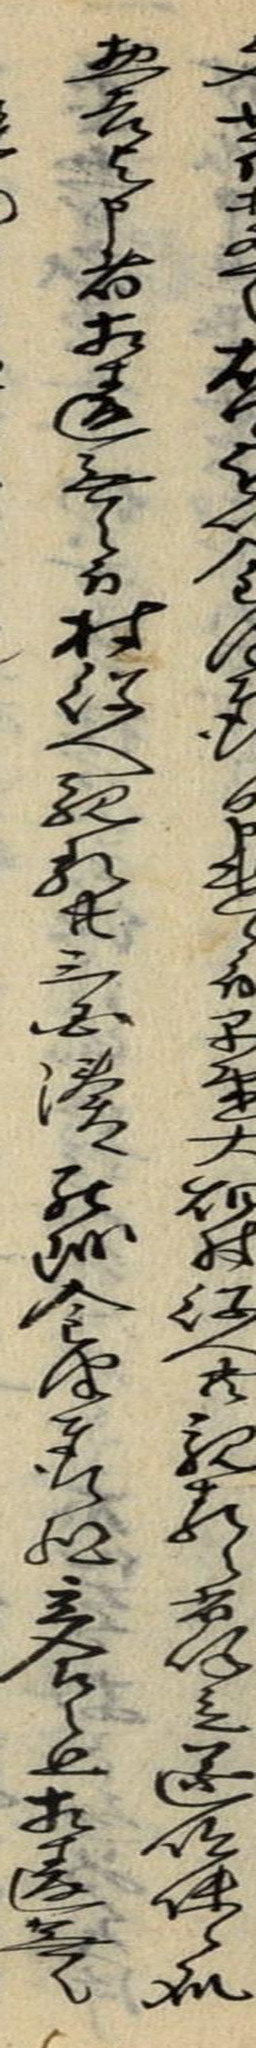惣吉と申者相違無之に付村役人親類共三国湊へ罷越金津奉行組立合之上相違無之
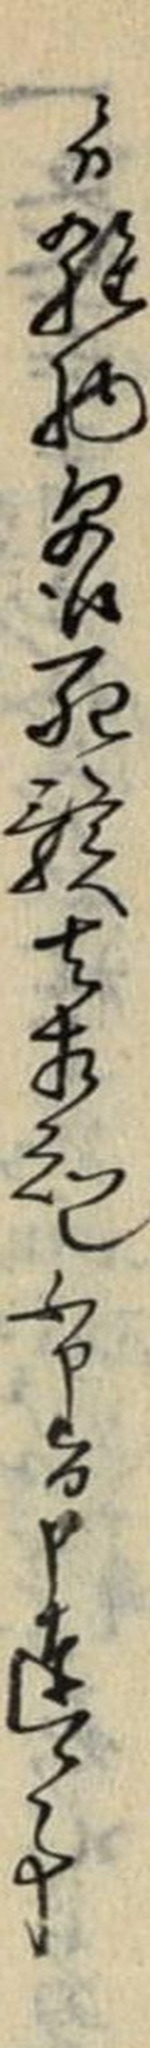に付雑物受取死骸は相知レ不申旨申達候事
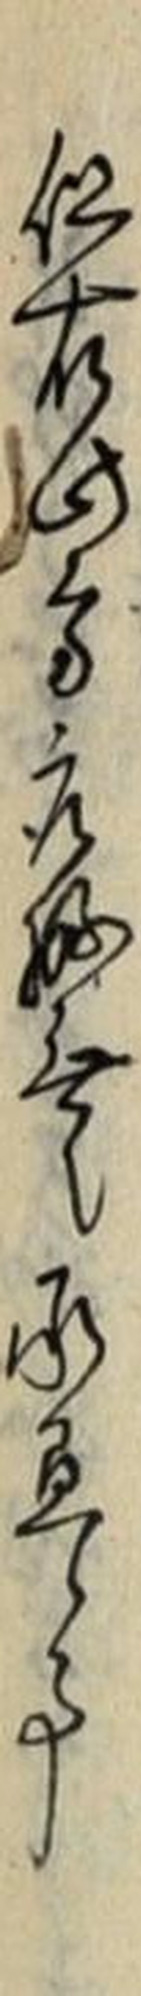但右此方取扱無之承置候事
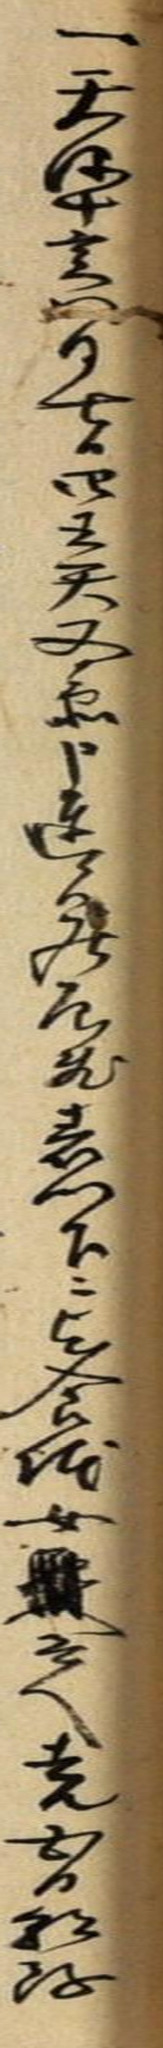一天保十亥月七日四王天又兵衛申達候は居屋敷表門下に乞食体女壱人去ル五日朝致
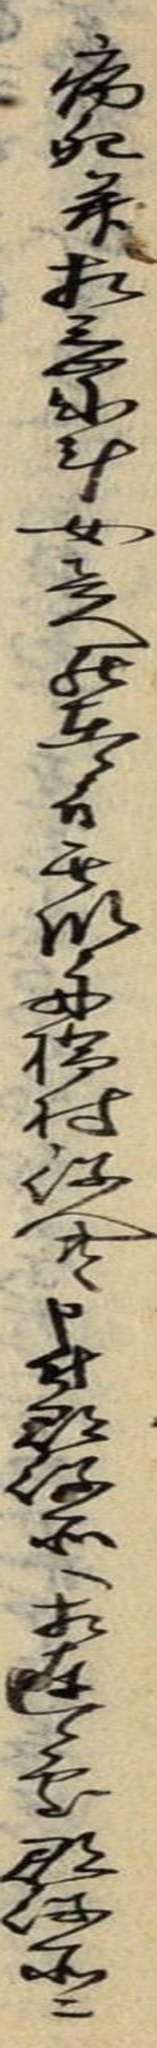病死并拾三歳斗女壱人罷在候に付其段舟橋村役人共へ申付郡役所へ相達候処郡役所に
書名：御停止異変死失
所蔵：福井県文書館 Fukui Prefectural Archives
